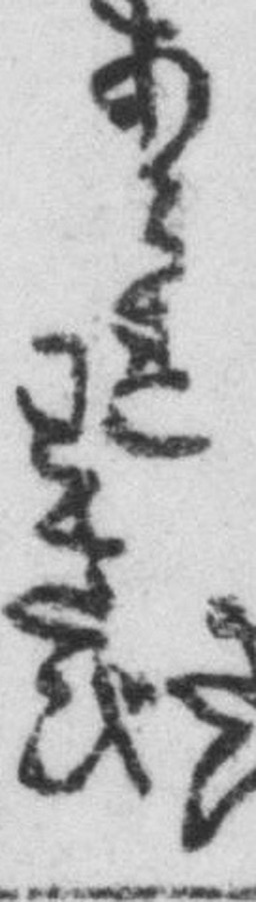わさび
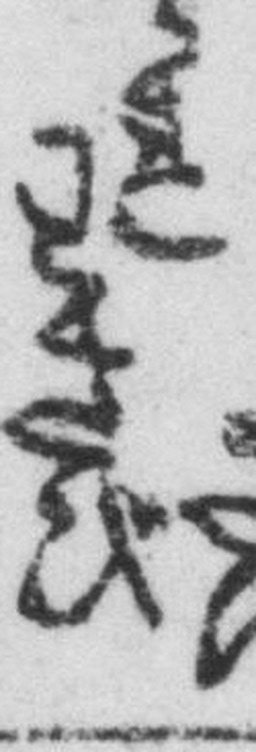わさび
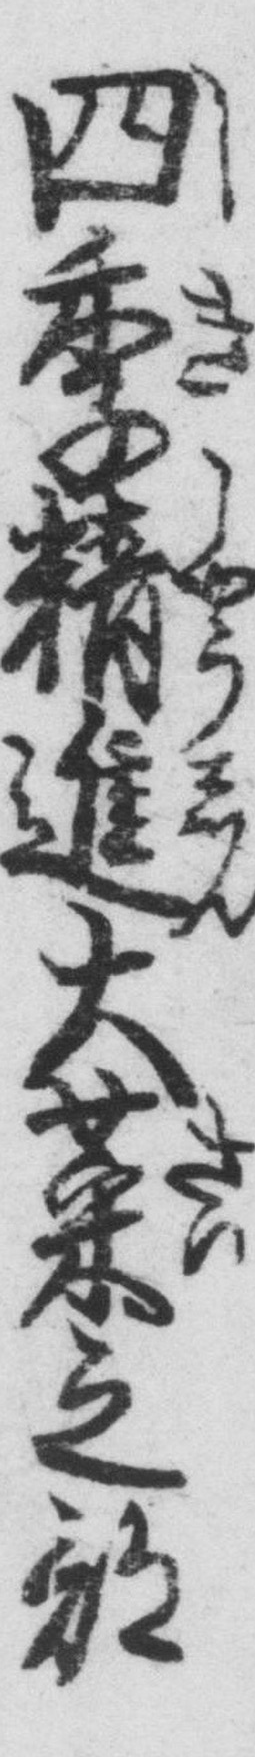四季精進大菜之部
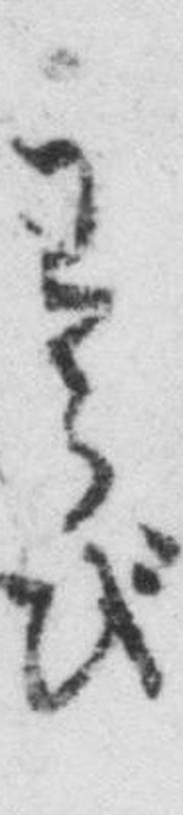わさび
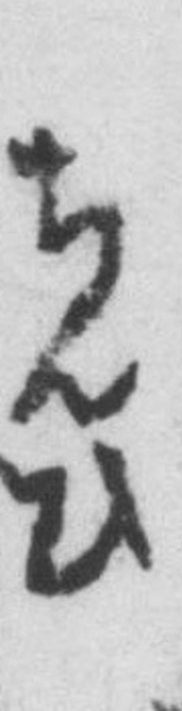ちんひ
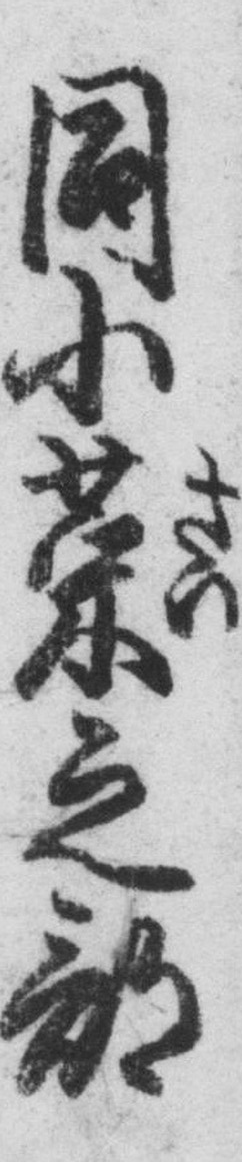同小菜之部
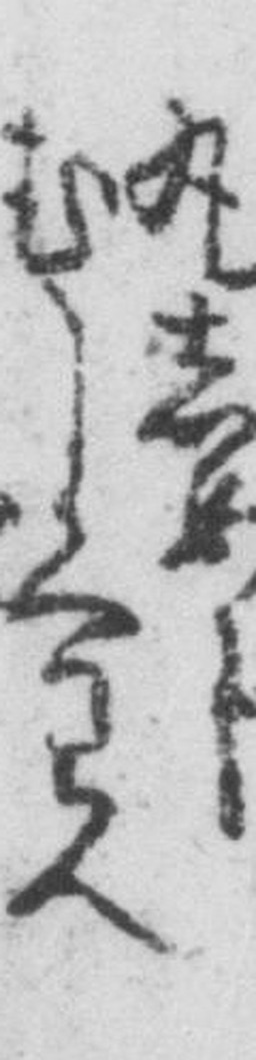むしくわい
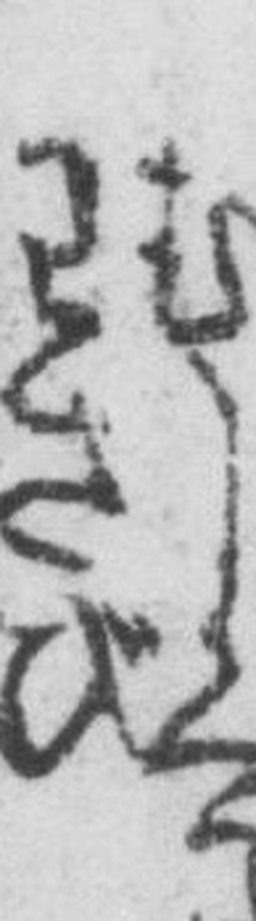わさび
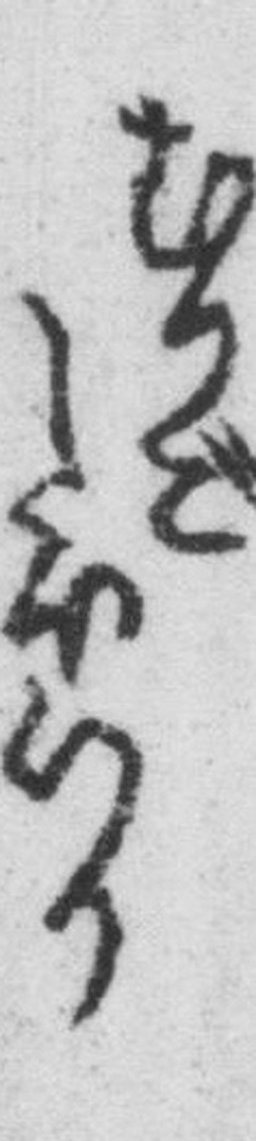しほいり
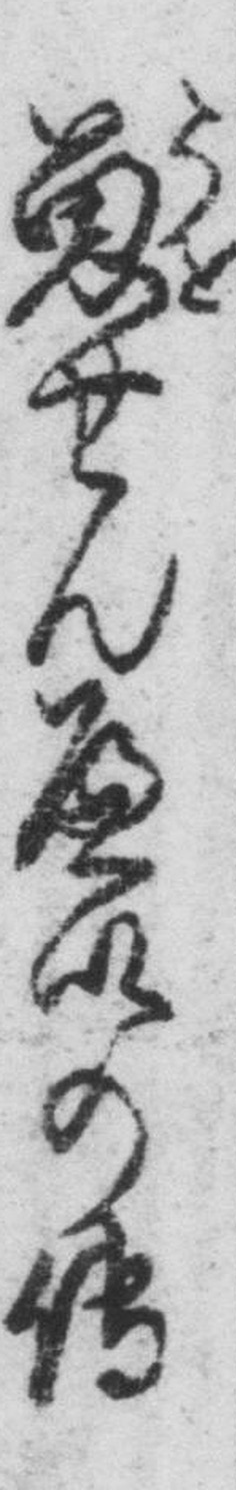魚せんべいの傳
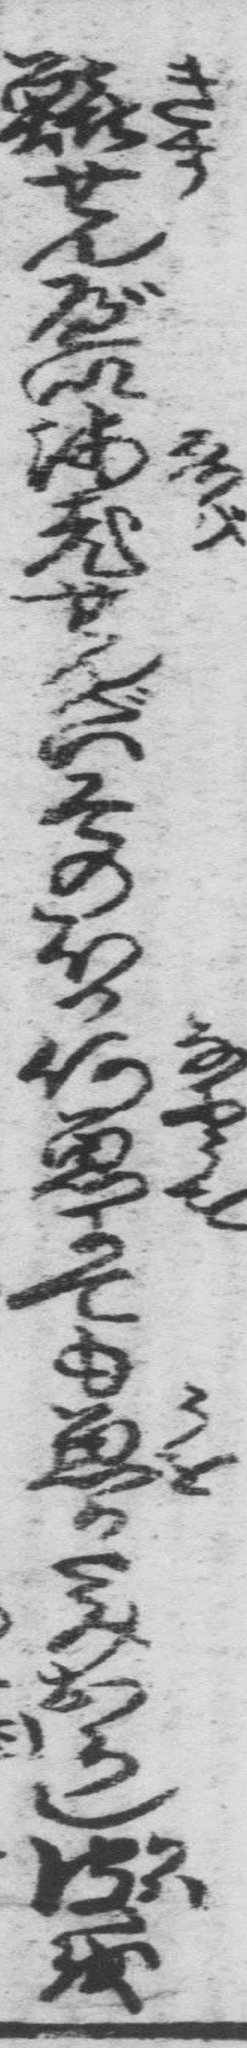鱚せんべい海老せんべいそのほか何魚にてもかたみおろし皮を
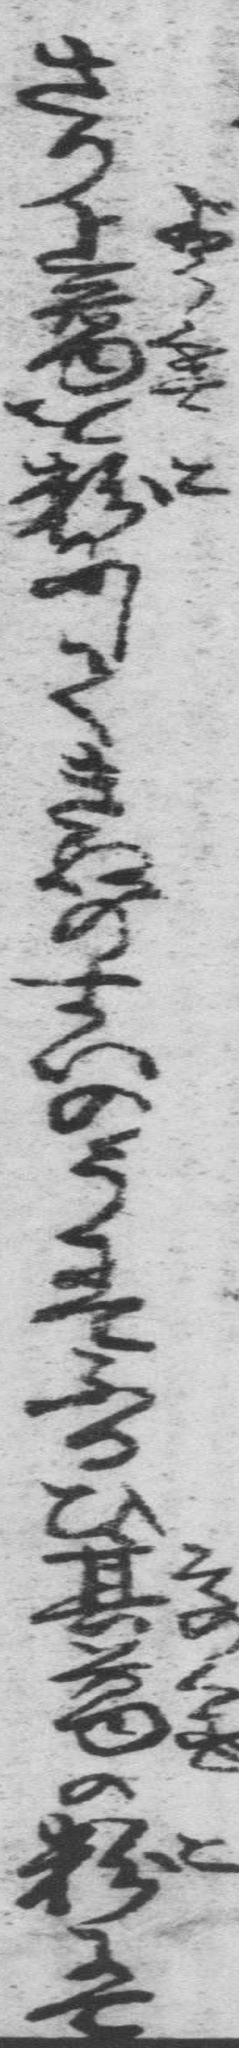さり上葛を粉てきぬのすいのうにてふくひ其葛の粉にて

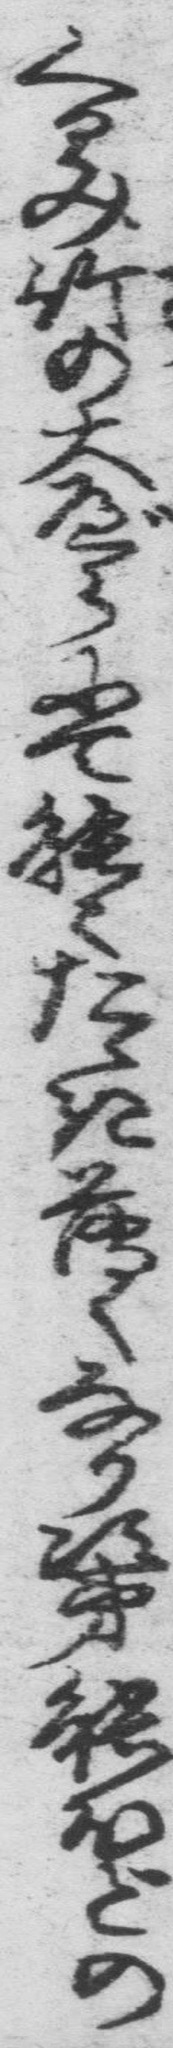くるみ竹の大べらにて能々たゝき薄くなり次第能ほどの
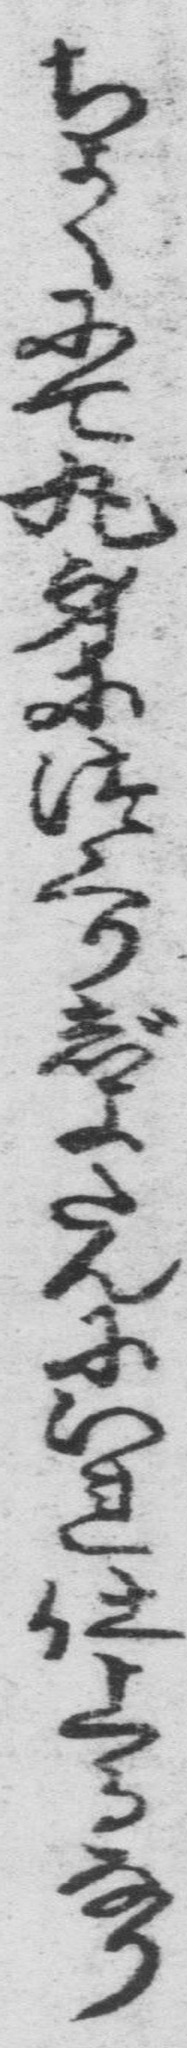ちよくにて丸身につくりじよたんにいれ仕上るなり
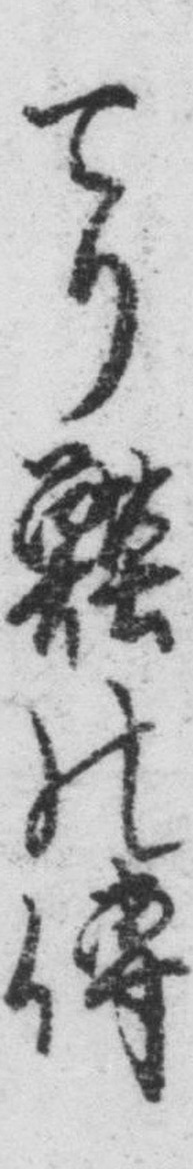てり鰹の伝
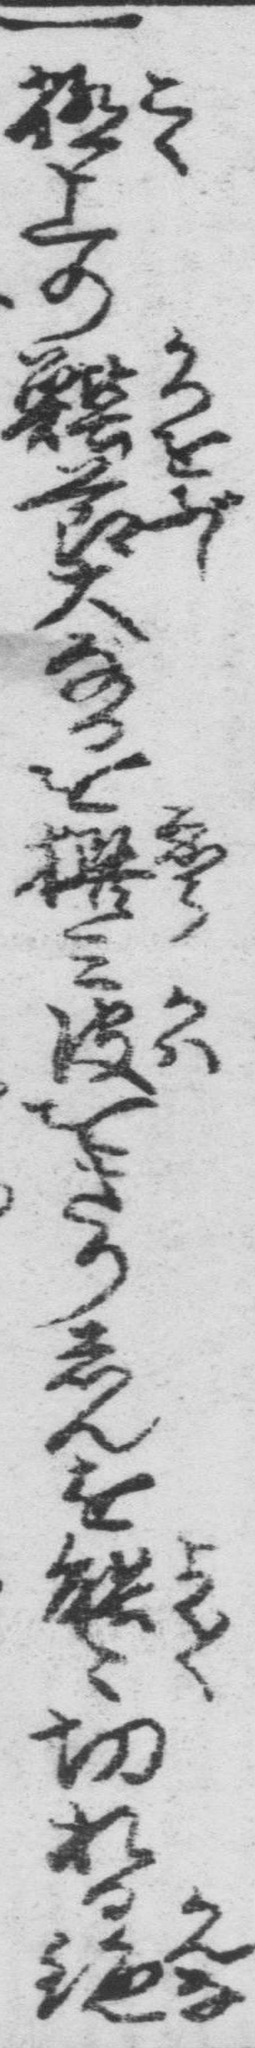一極上の鰹節大なるを撰み皮をさりしんを能々切れる鉋
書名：即席庖丁
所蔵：大阪府立大学学術情報センター 国文学研究資料館
